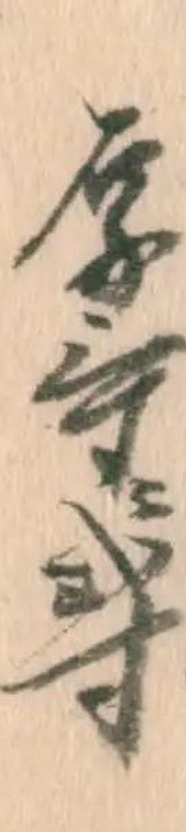厚三寸に弐寸
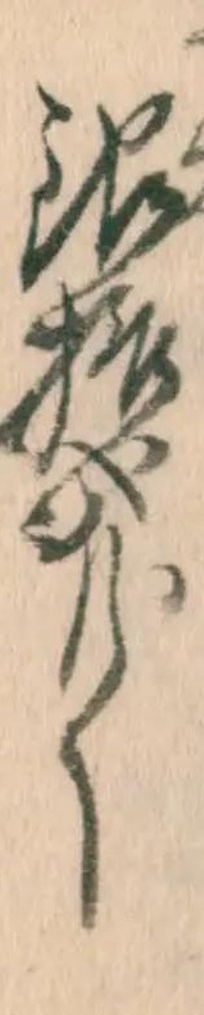銀拾弐匁
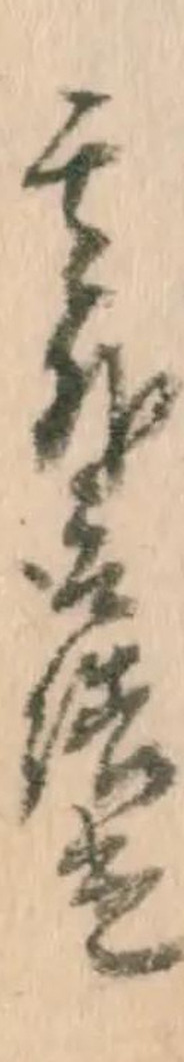其外取繕遣

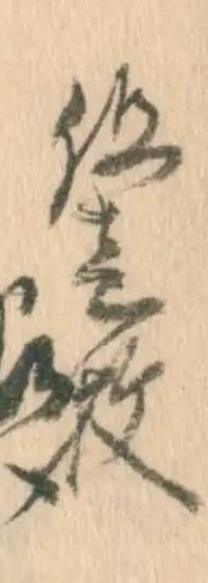但壱枚
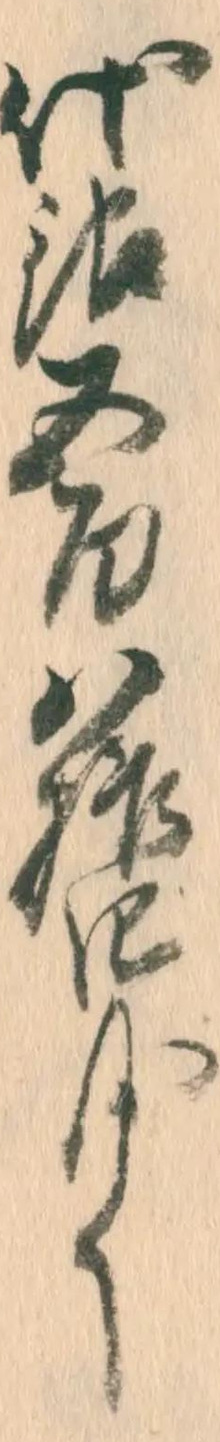代銀五百八拾四匁銀八分
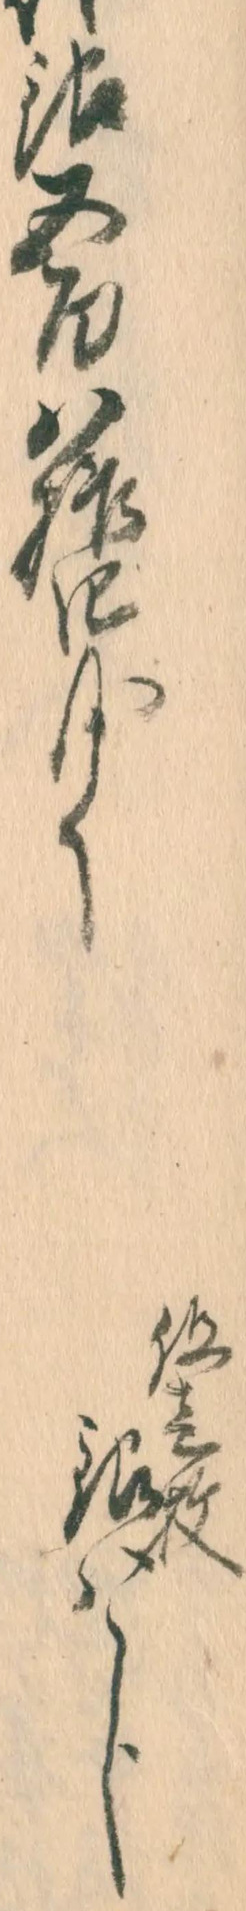代銀五百八拾四匁銀八分
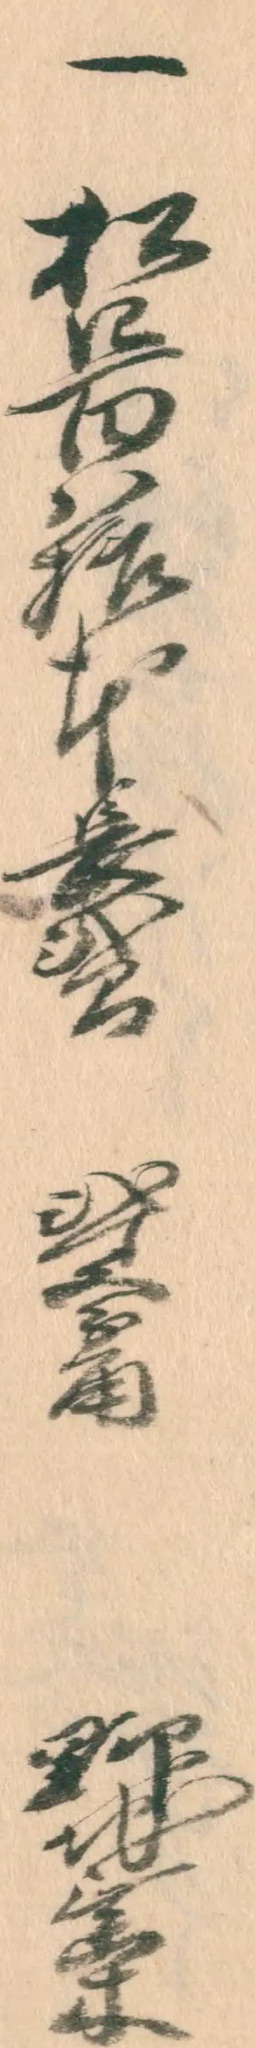一松四百八拾本長弐間弐寸五分角野地垂木
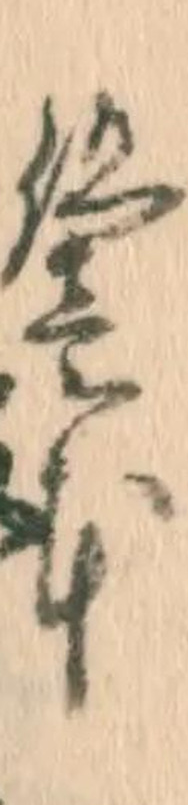但壱本
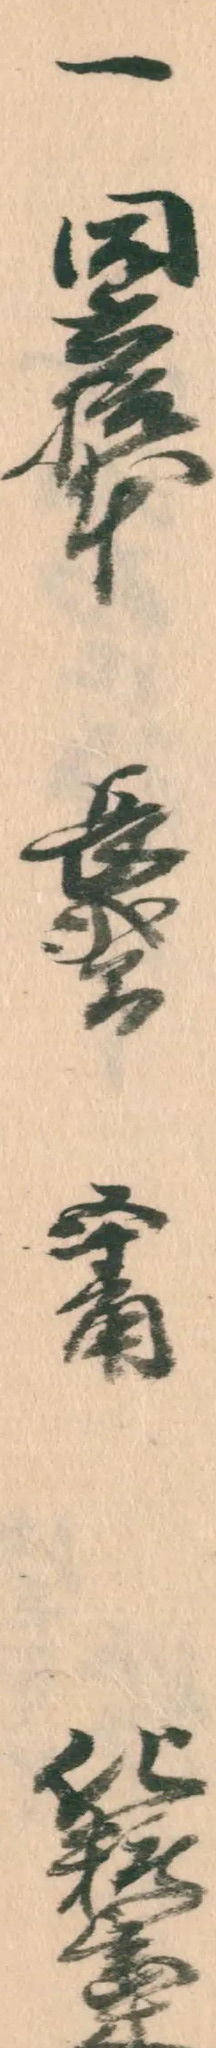一同六拾本長弐間五寸角化粧垂木
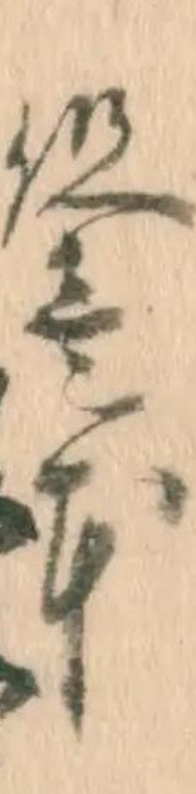但壱本
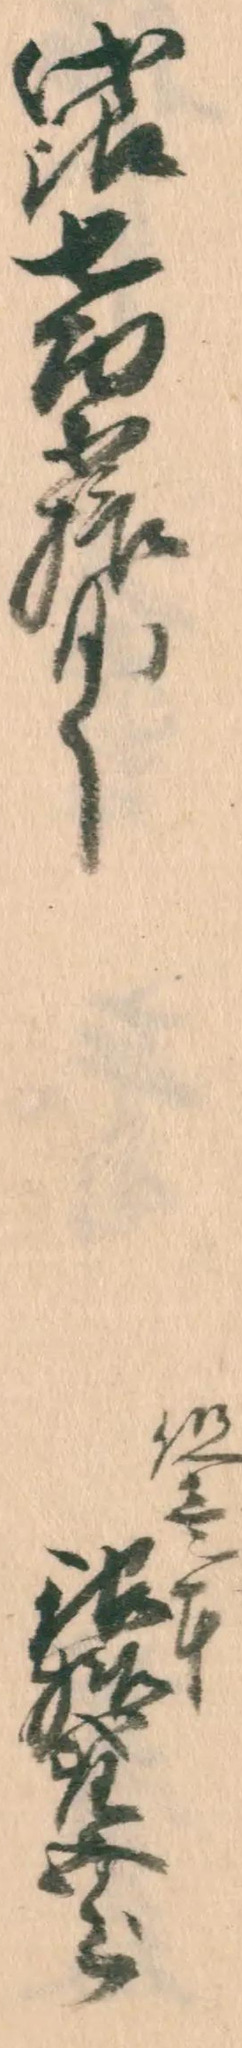代銀七百五拾匁銀拾弐匁五分
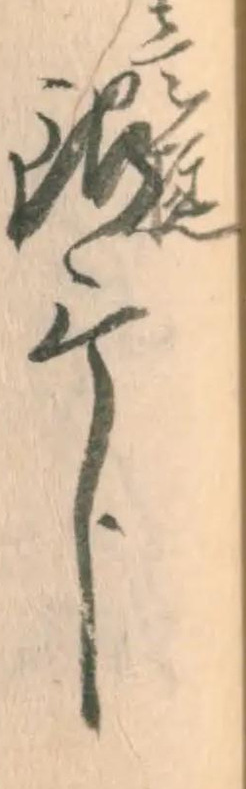銀三分
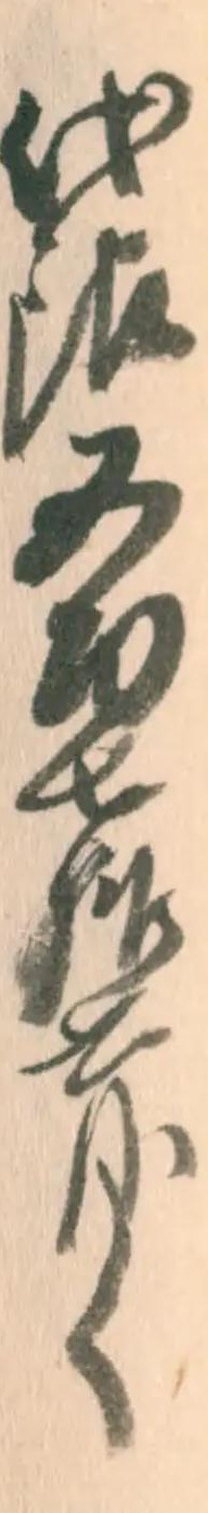代銀五百七拾六匁但壱挺
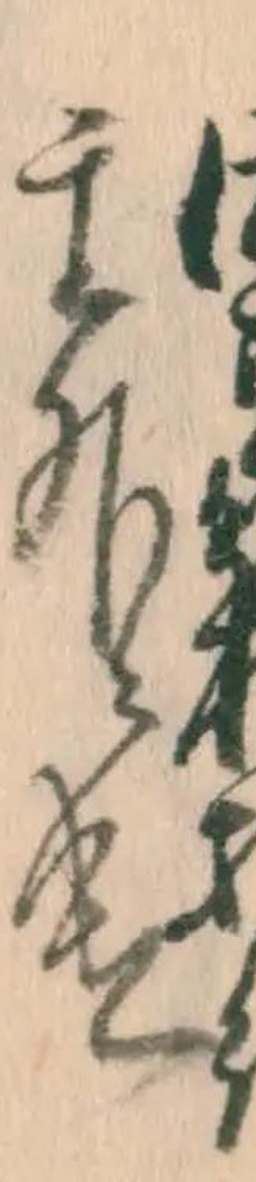其外に遣
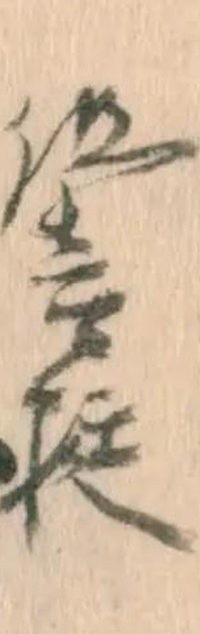但壱挺
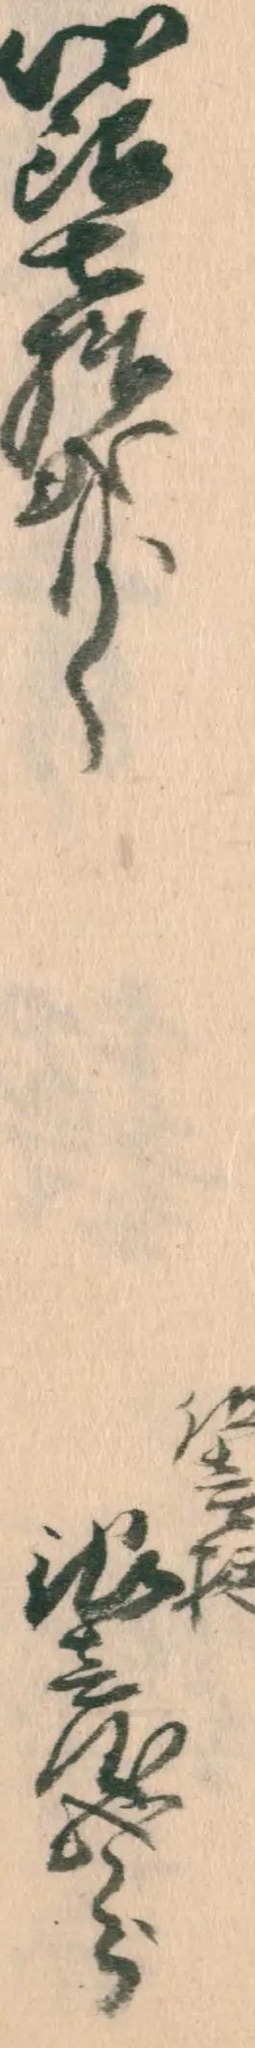代銀七拾弐匁銀壱匁弐分
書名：三十三間堂. [1]
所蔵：国立国会図書館 National Diet Library, JAPAN
